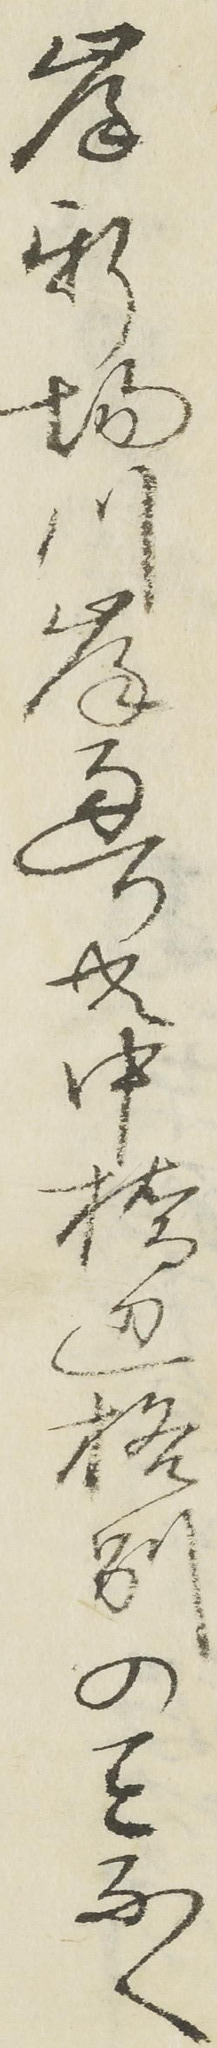岸新場川岸通り共中橋辺格別のことなく
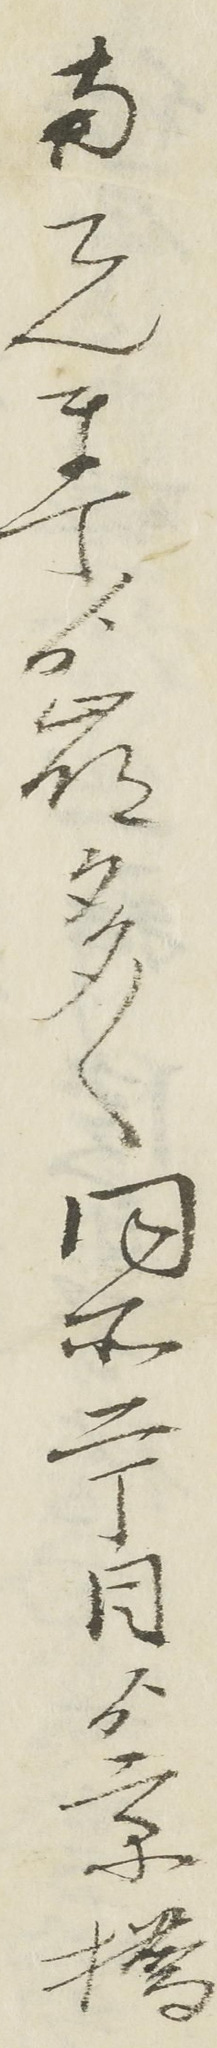南てんま丁ゟ崩多く同所二丁目ゟ京橋
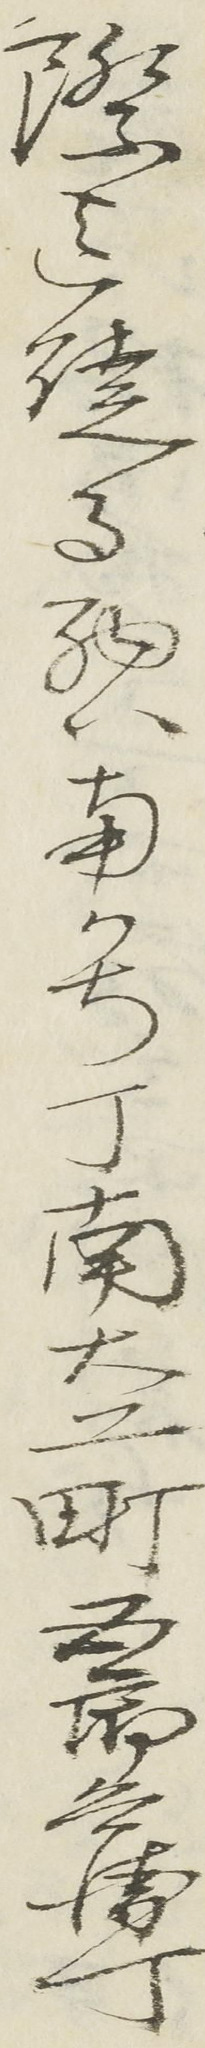際迄焼る西ハ南かち丁南大工町五郎兵衛丁
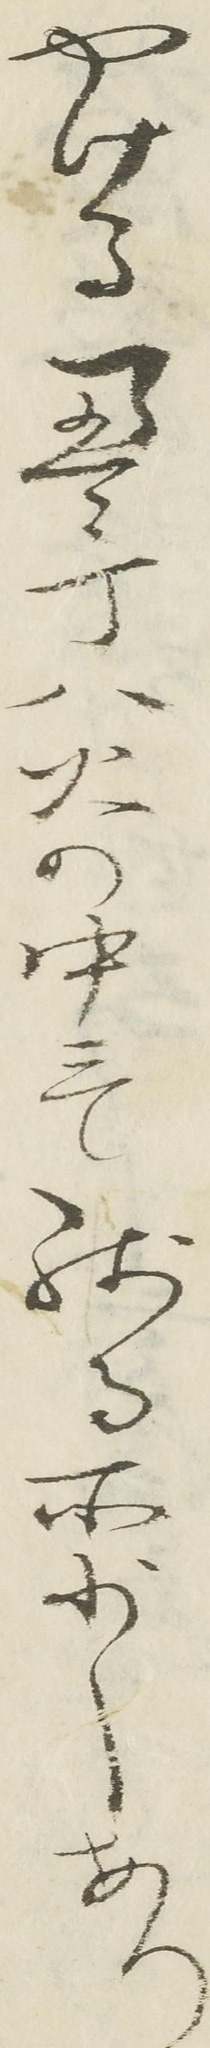やける畳丁ハ火の中ニて残る所少しあり
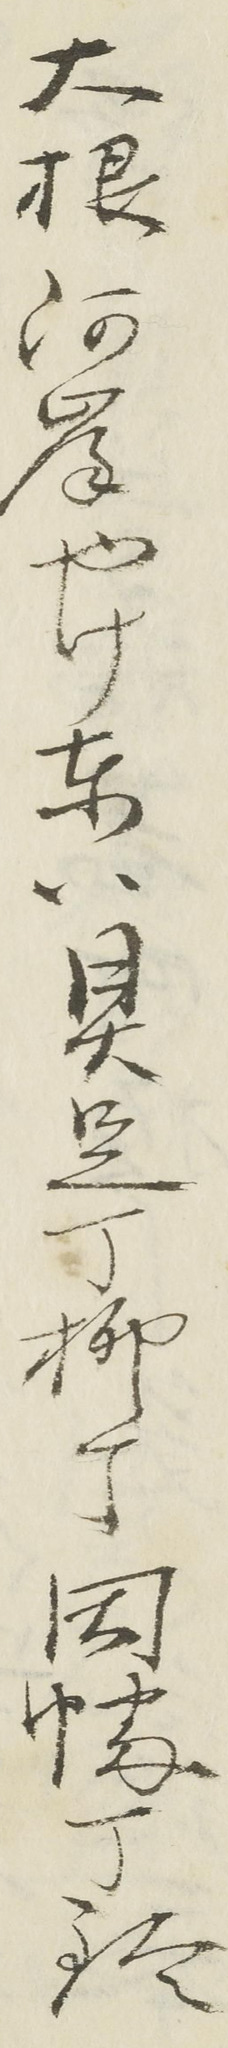大根河岸やけ東ハ具足丁柳丁因幡丁鈴
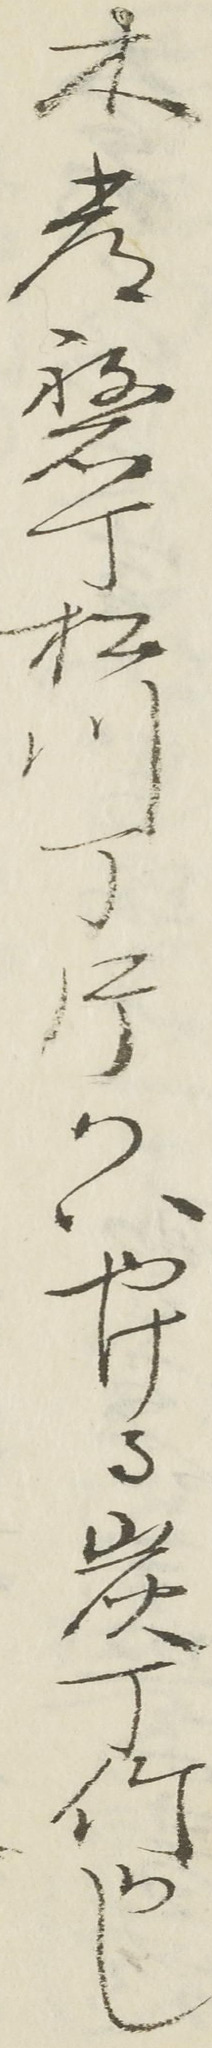木常盤丁松川丁片かハやける炭丁竹かし
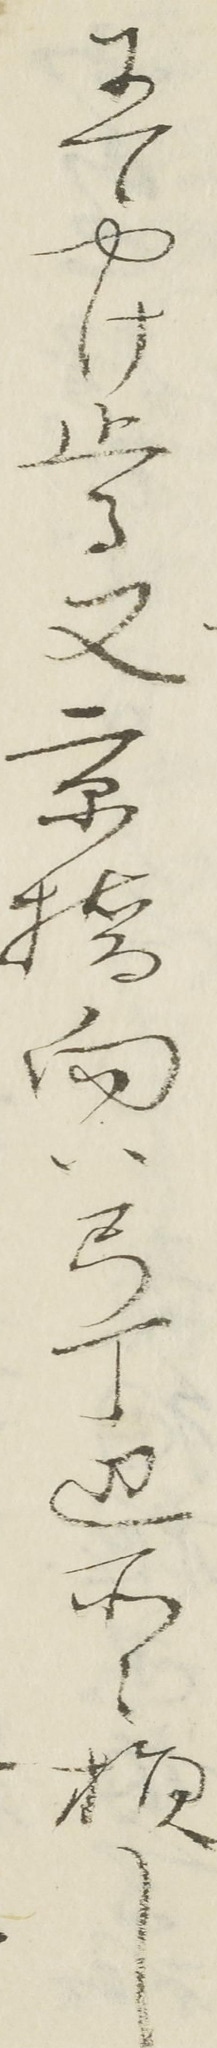にてやけ止る又京橋向ハ弓丁辺所〻損し
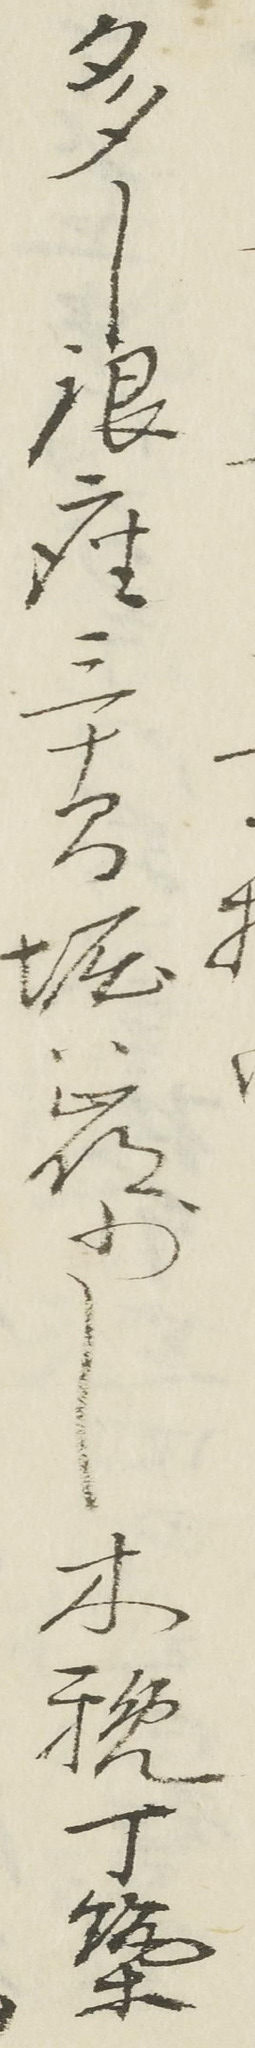多し銀座三十間堀ハ崩少し木挽丁築
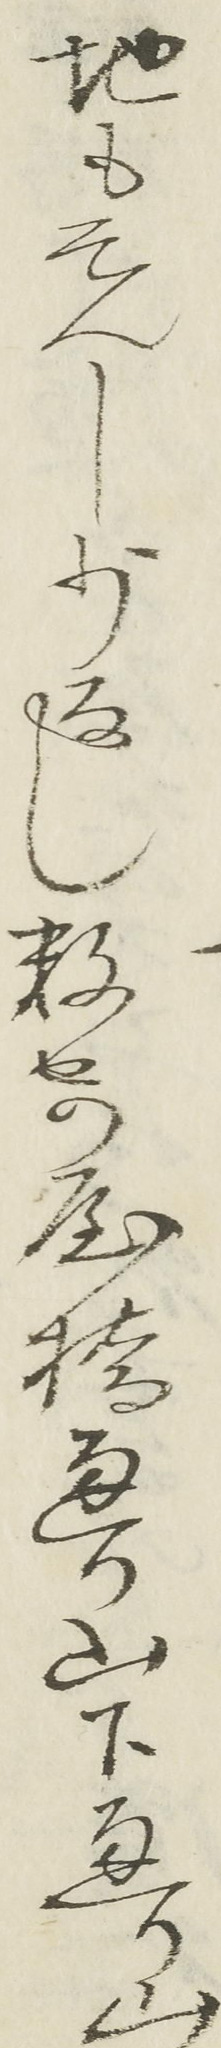地もそんし少なし数寄屋橋通り山下通り山
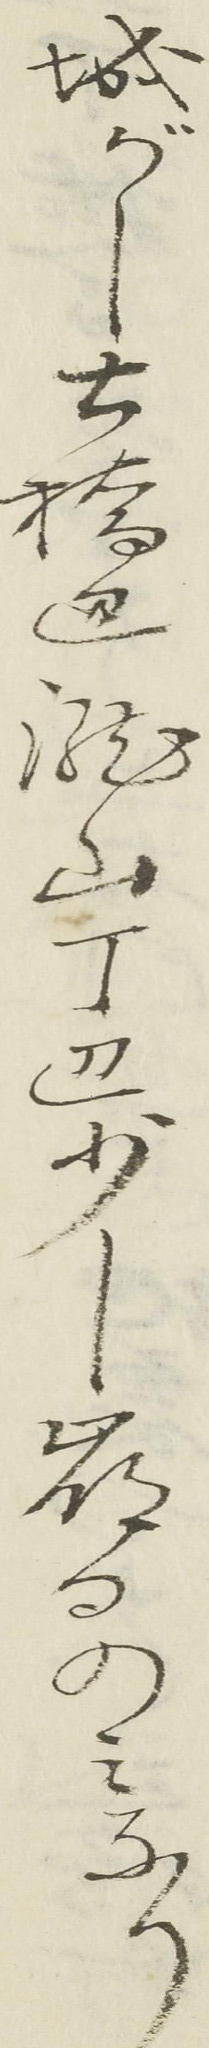城がし土橋辺瀧山丁辺少し崩るのミなり
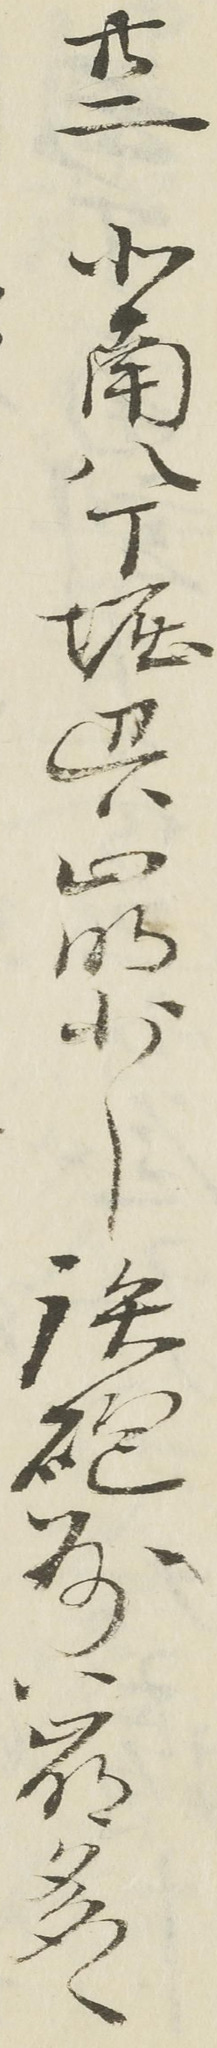廿二北角八丁堀辺ハ崩少し鉄砲前ハ崩多く
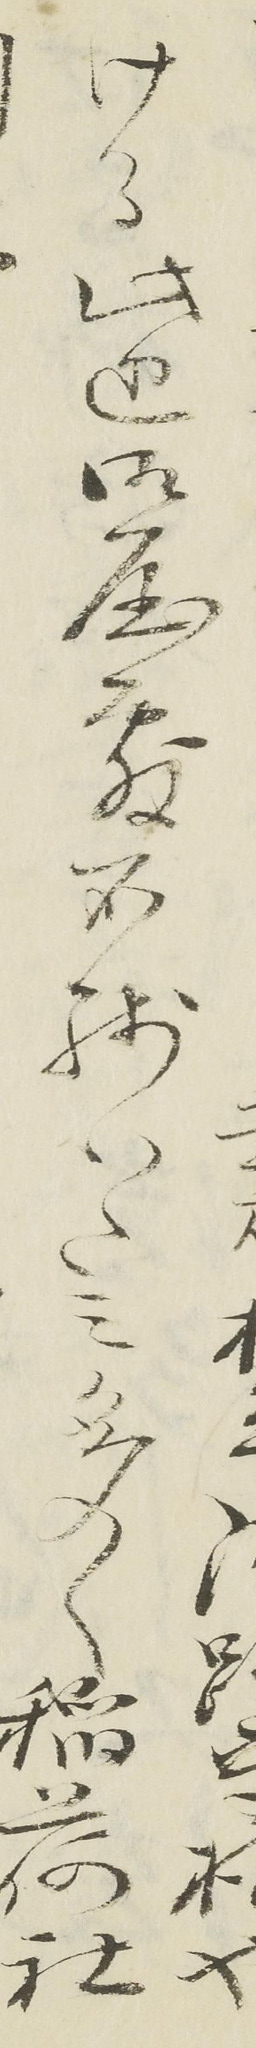ける此辺御屋敷不残いたミ多く稲荷社
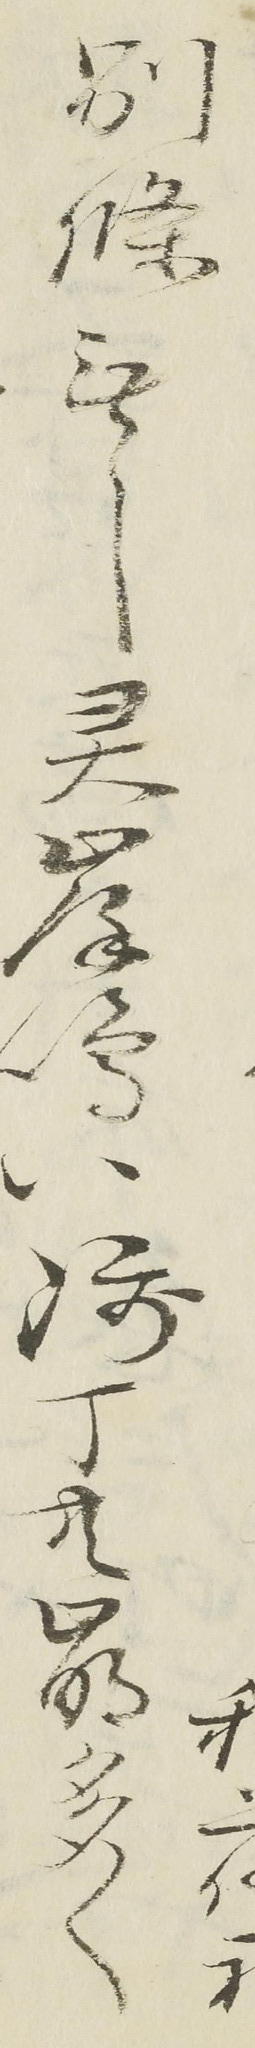別條無し霊岸嶋ハ湊丁共崩多く
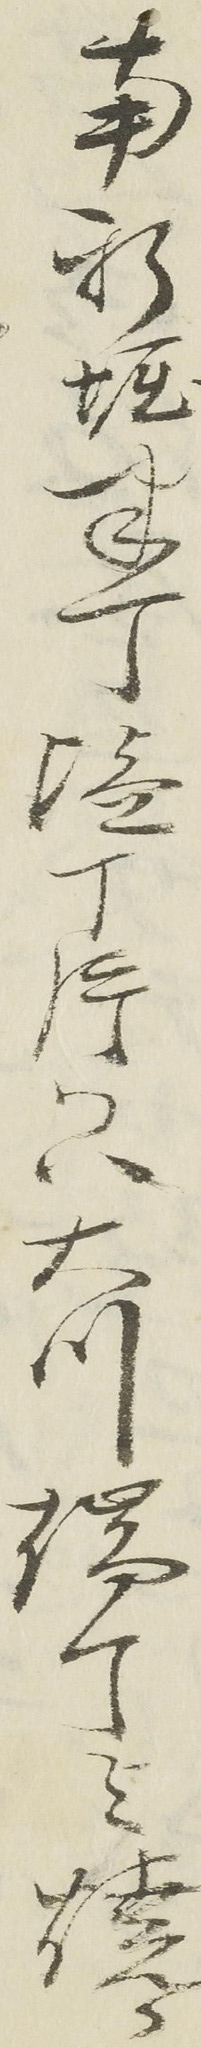南新堀半丁塩丁片かハ大川端丁と焼ケ
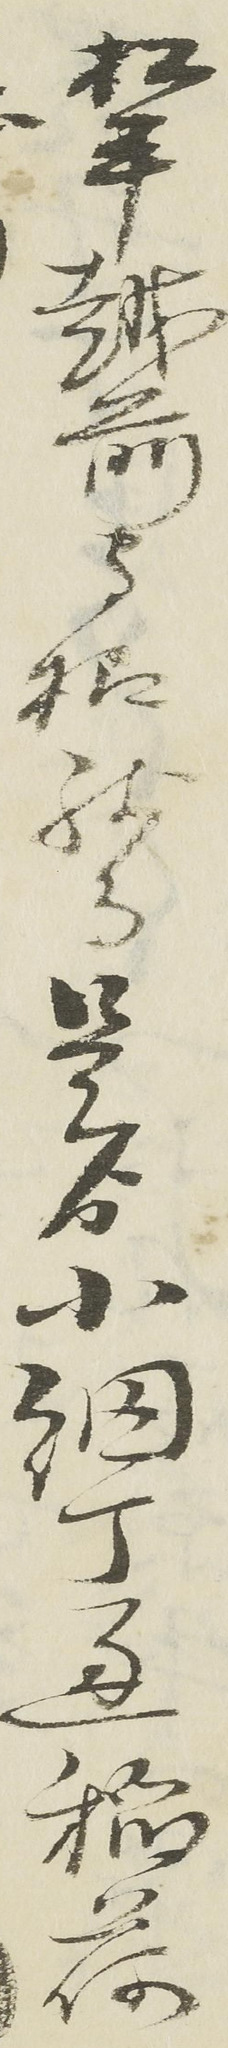松平越前守様残る是ゟ小網丁通稲荷
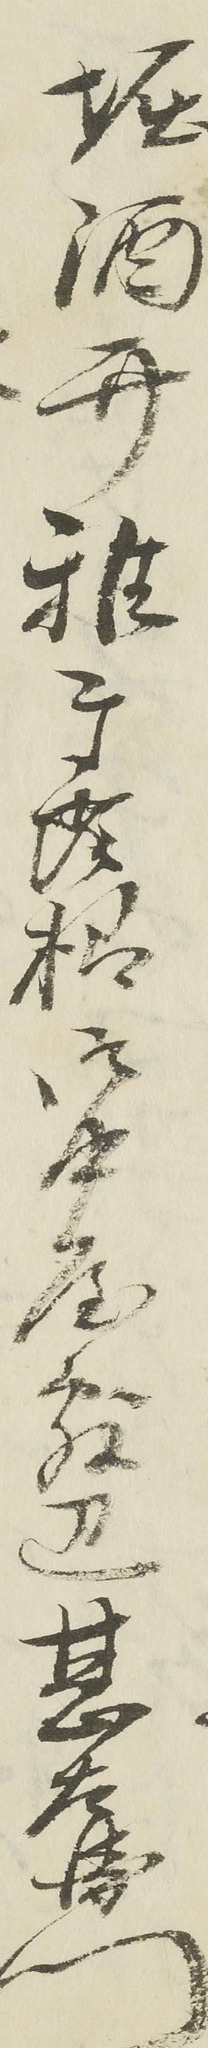堀酒井雅楽頭様御中屋敷辺甚左衛門
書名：安政乙卯江戸大地震筆記　安政丙辰八月大阪大雷雨之記追加　安政三辰年七月松前辺大地震并八月大風雨記録
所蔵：東京大学地震研究所図書室 Earthquake Research Institute Library, The University of Tokyo, JAPAN
